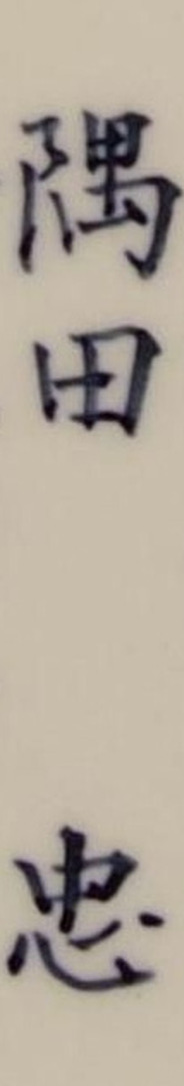隅田忠
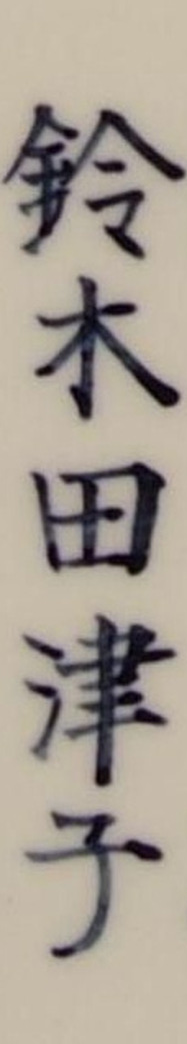鈴木田津子
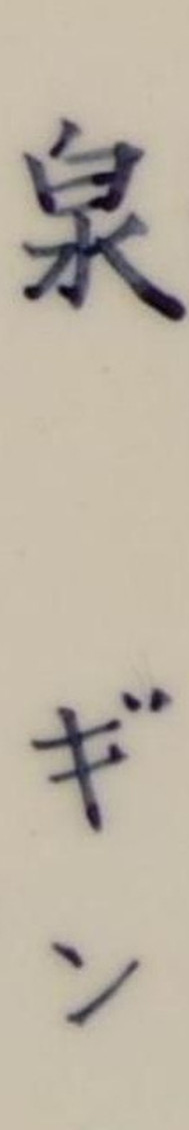泉ギン
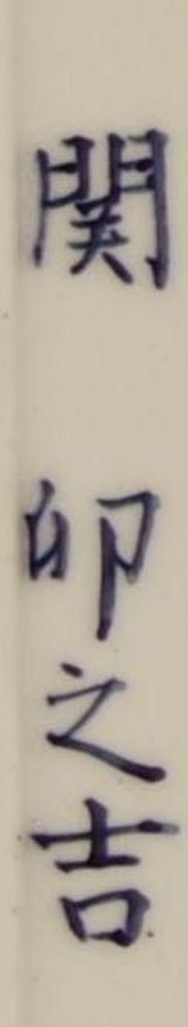関卯之吉

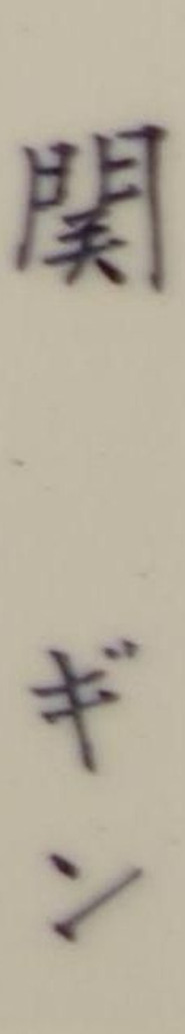関ギン
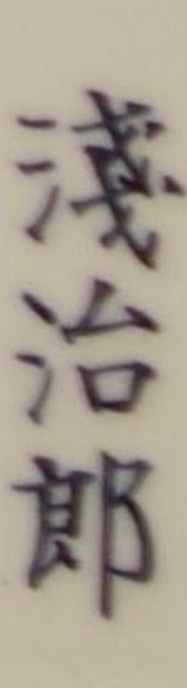浅治郎
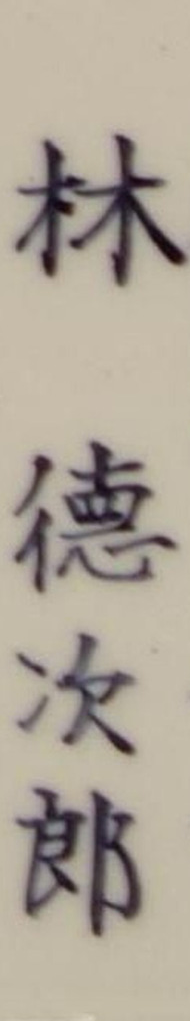林徳次郎
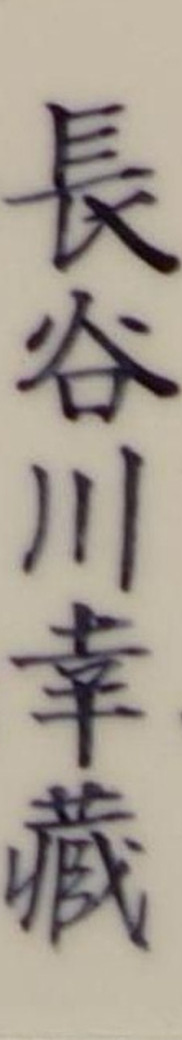長谷川幸蔵
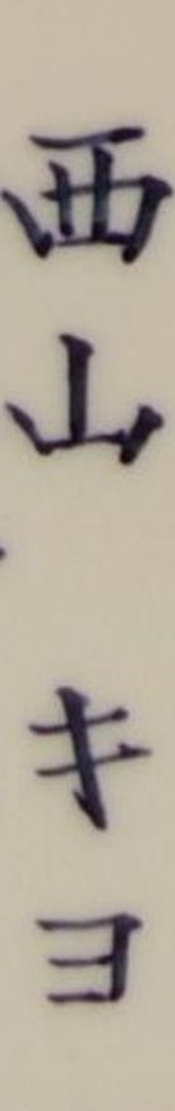西山キヨ
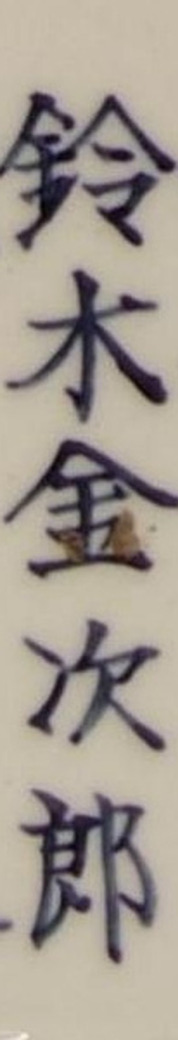鈴木金次郎

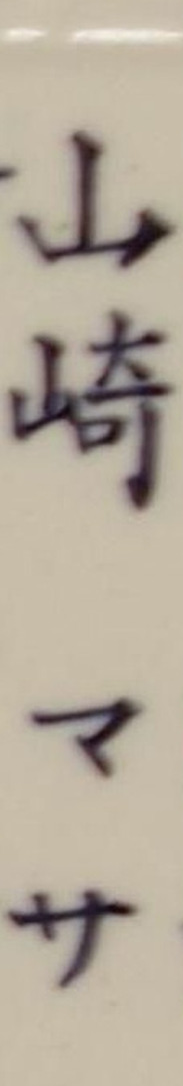山崎マサ
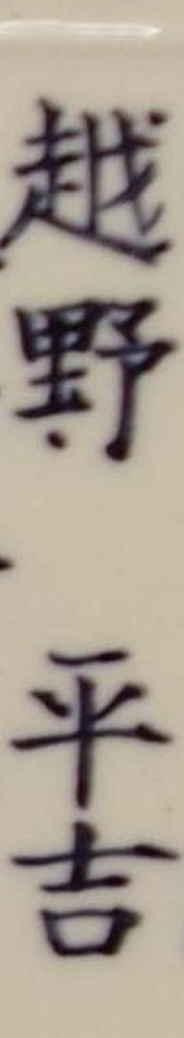越野平吉
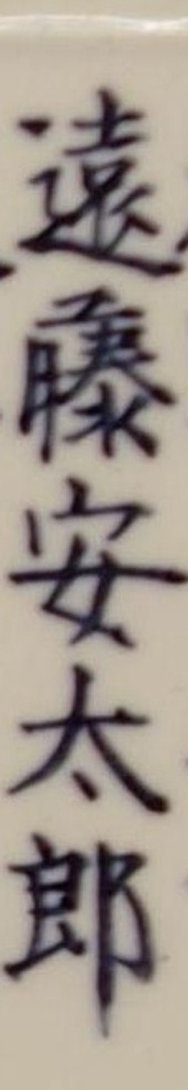遠藤安太郎
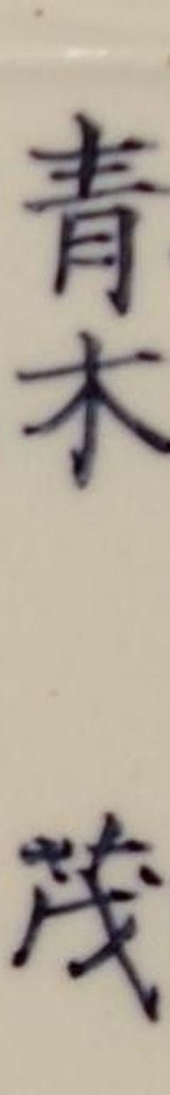青木茂
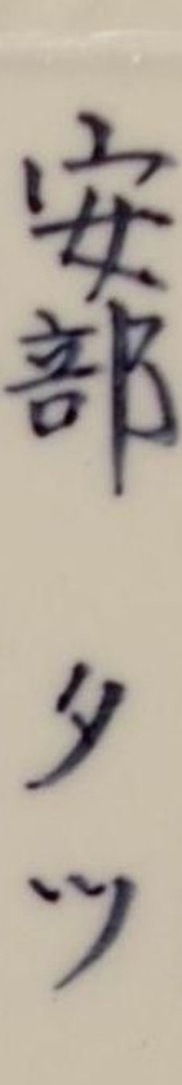安部タツ
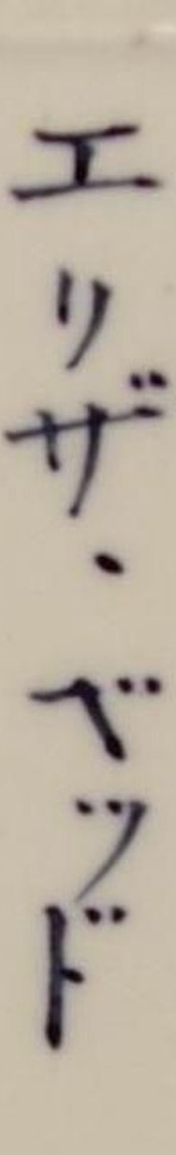エリザ、ベッド
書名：M~S
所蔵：高野山金剛峯寺
